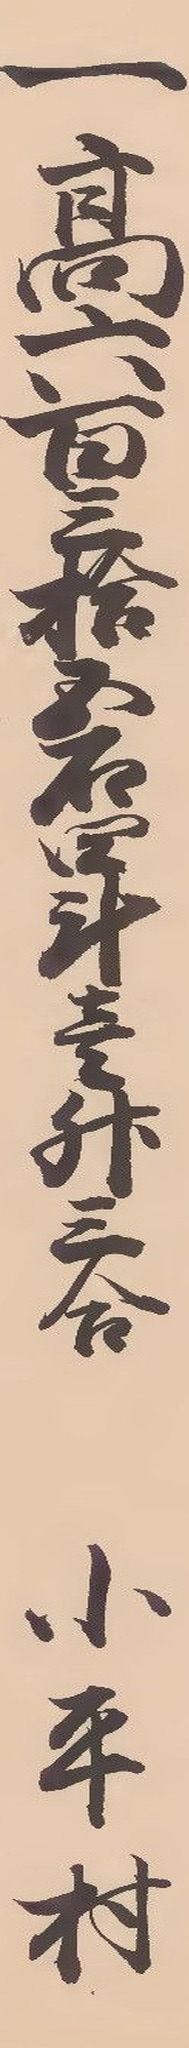一高六百三拾五石四斗壱升三合小平村
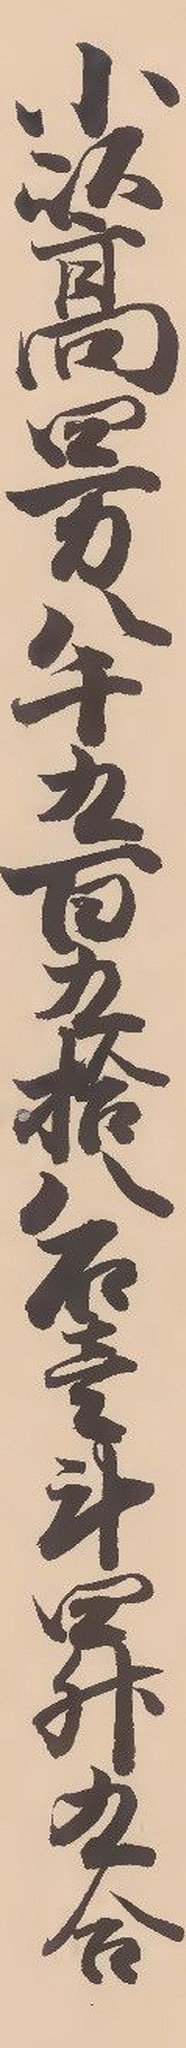小以高四万八千九百九拾八石壱斗四升九合

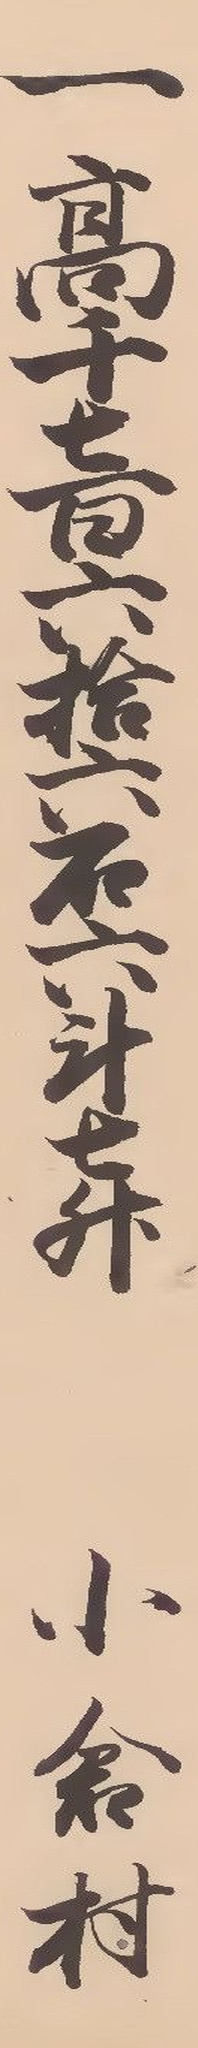一高千七百六拾六石六斗七升小倉村
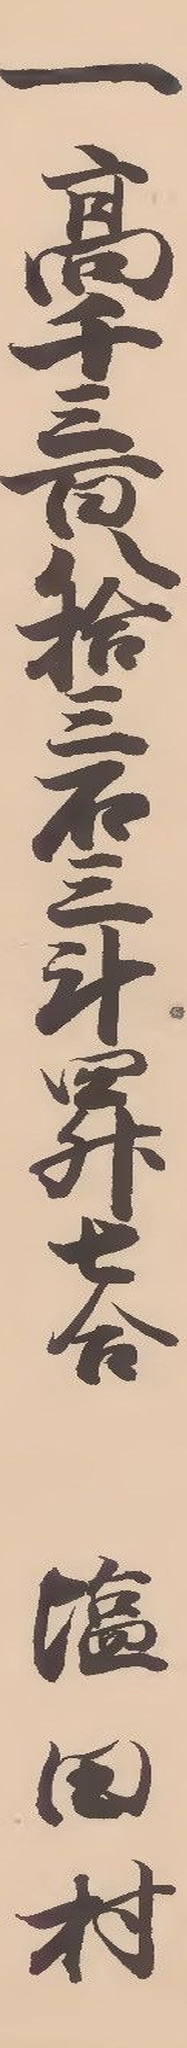一高千三百八拾三石三斗四升七合塩田村
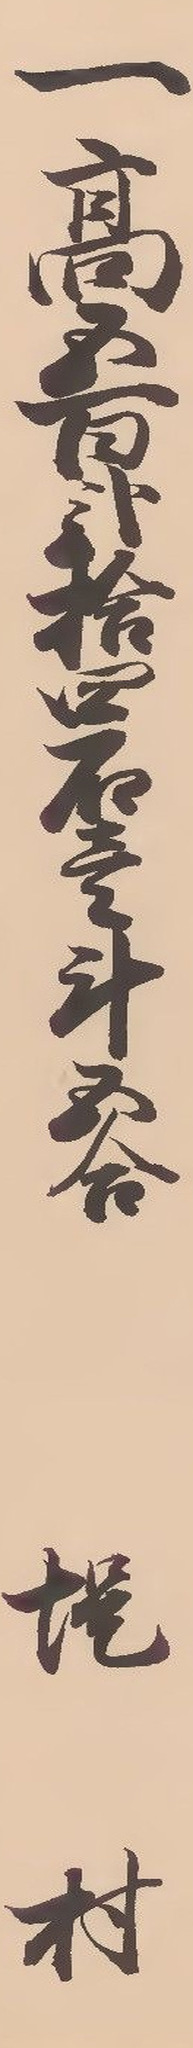一高五百弐拾四石壱斗五合堤村
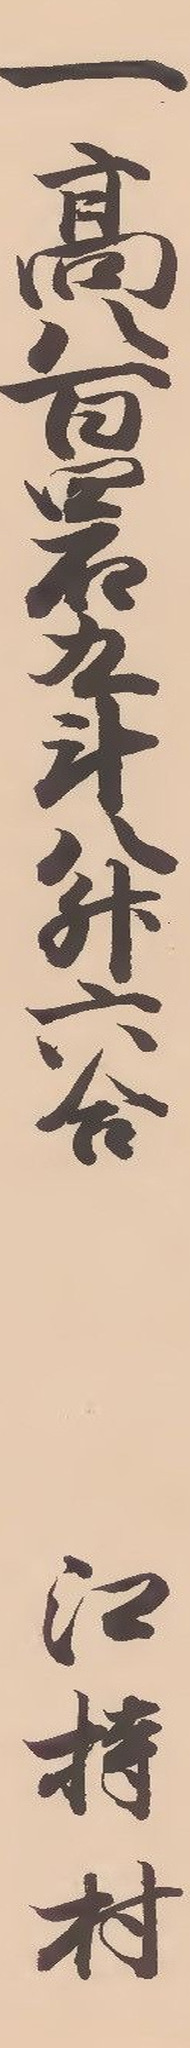一高八百四石九斗八升六合江持村
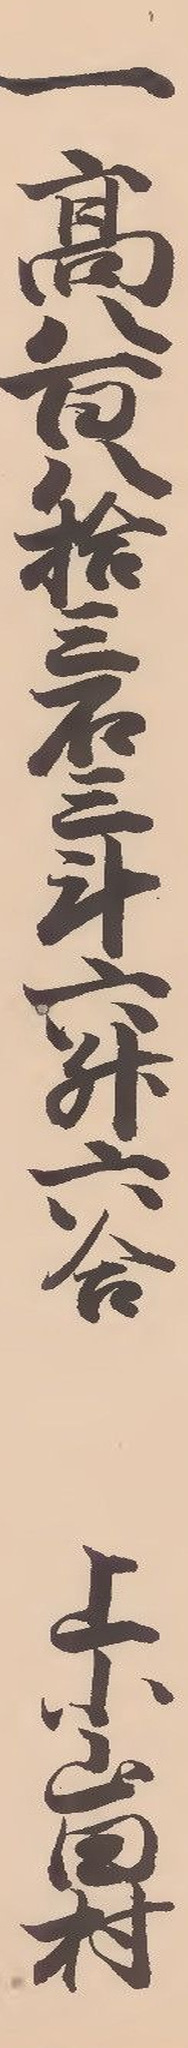一高八百八拾三石三斗六升六合上小山田村
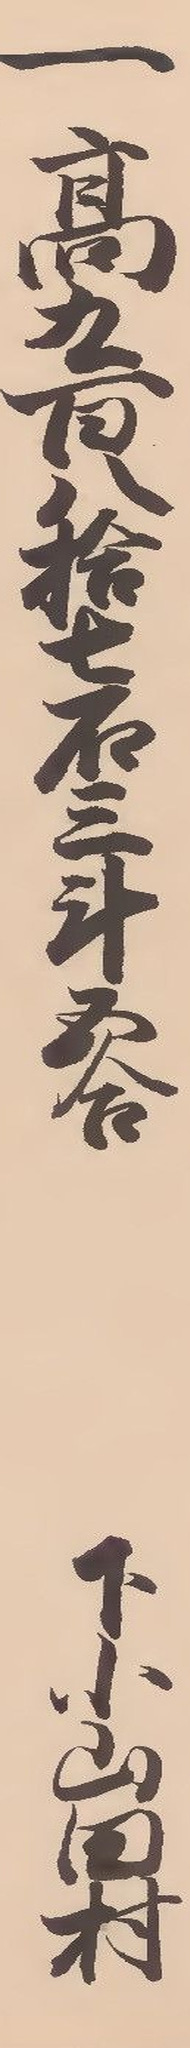一高九百八拾七石三斗五合下小山田村
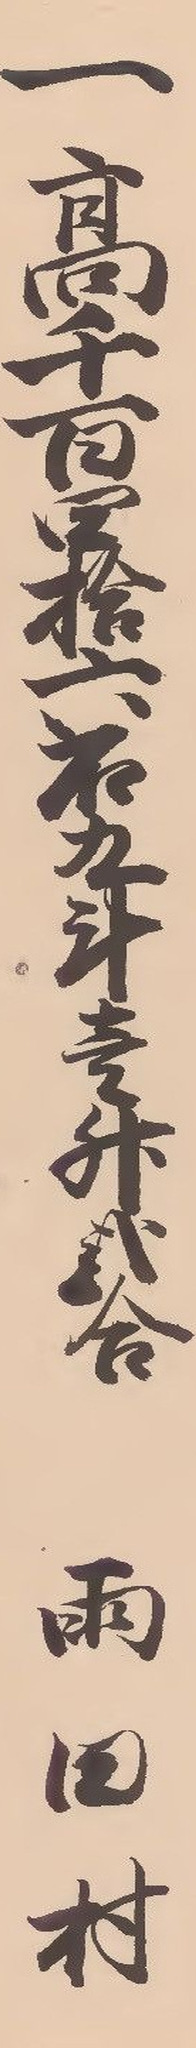一高千百四拾六石九斗壱升弐合雨田村

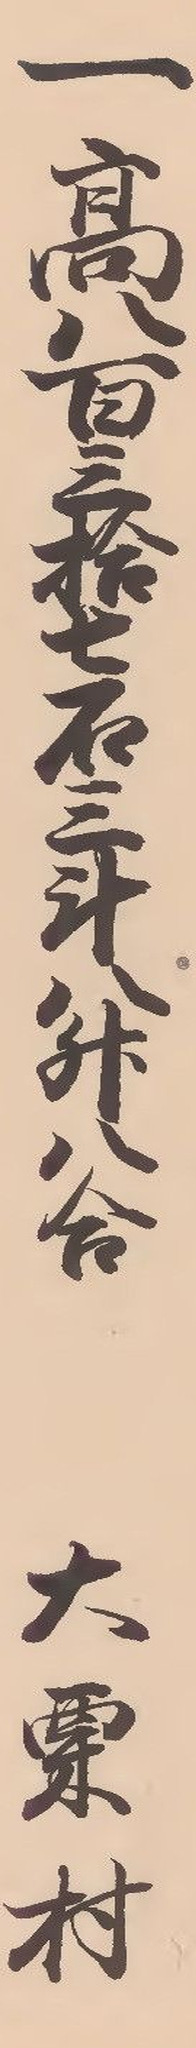一高八百三拾七石三斗八升八合大栗村
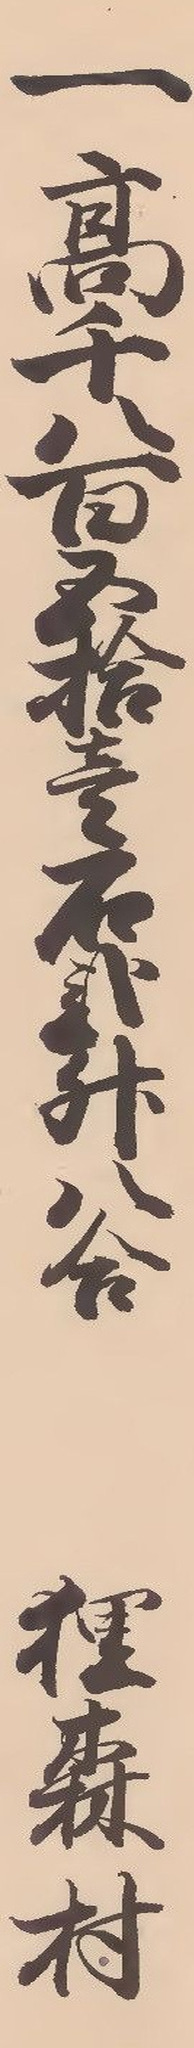一高千八百五拾壱石弐升八合狸森村
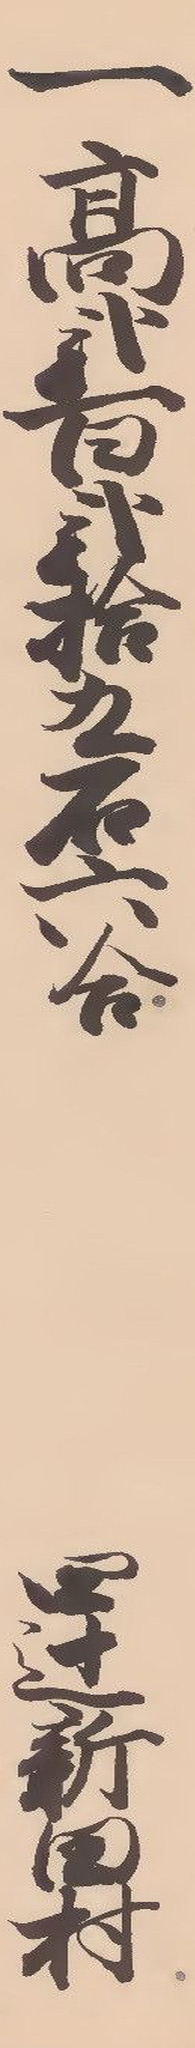一高弐百弐拾九石六合四辻新田村
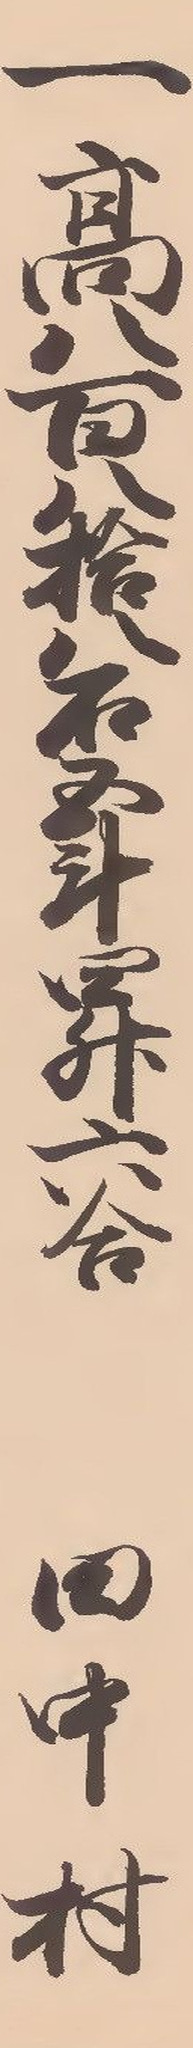一高八百八拾八石五斗四升六合田中村
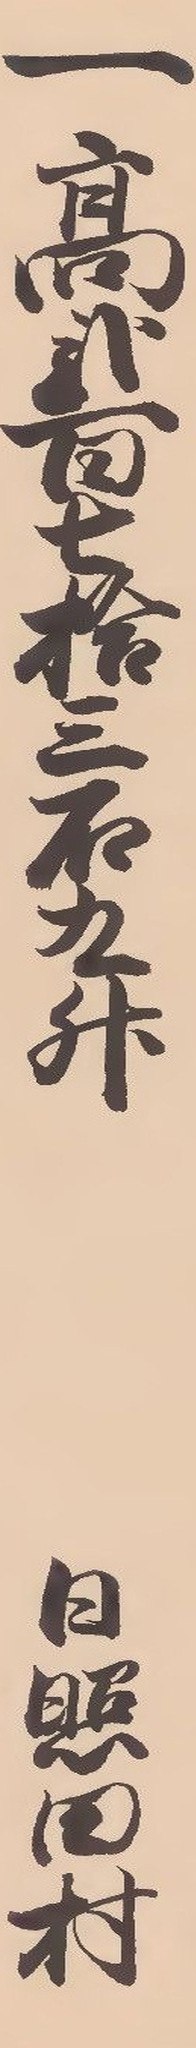一高弐百七拾三石九升日照田村
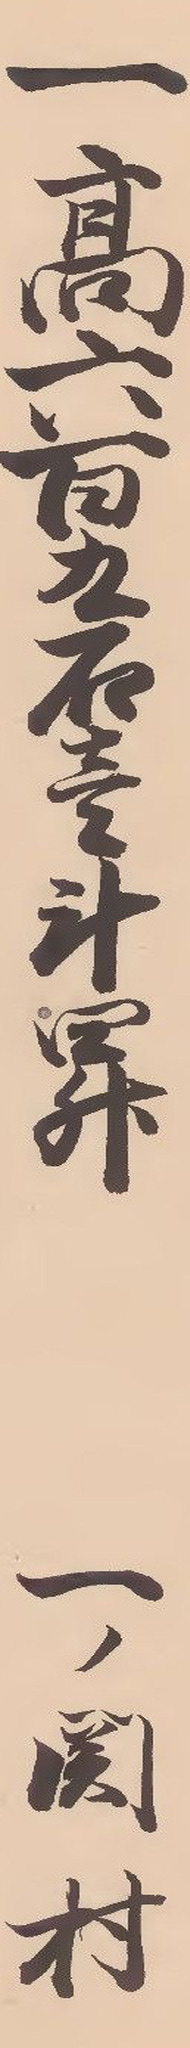一高六百九石壱斗四升一ノ関村
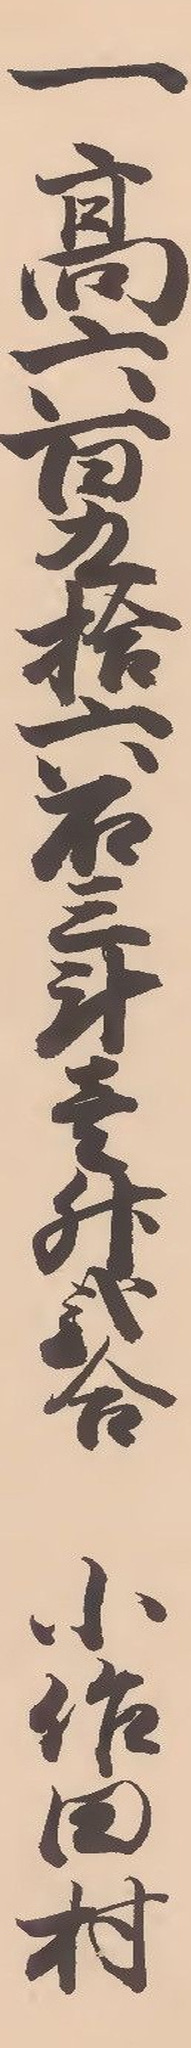一高六百九拾六石三斗壱升弐合小作田村
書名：陸奥国郷帳　２
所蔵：国立公文書館 National Archives of Japan
